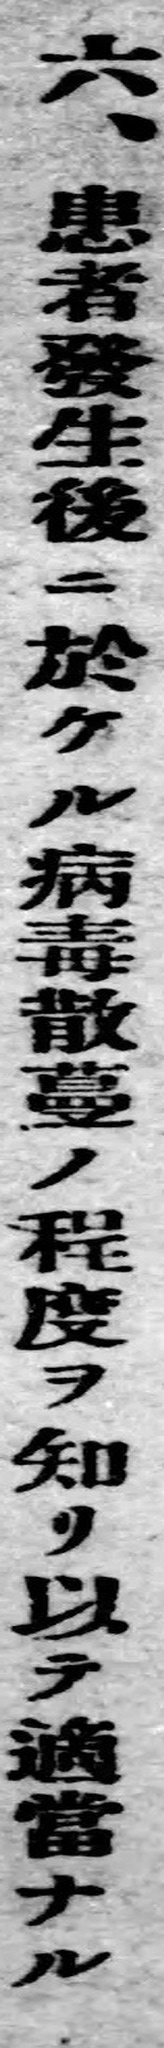六、患者發生後ニ於ケル病毒散蔓ノ程度ヲ知リ以テ適當ナル
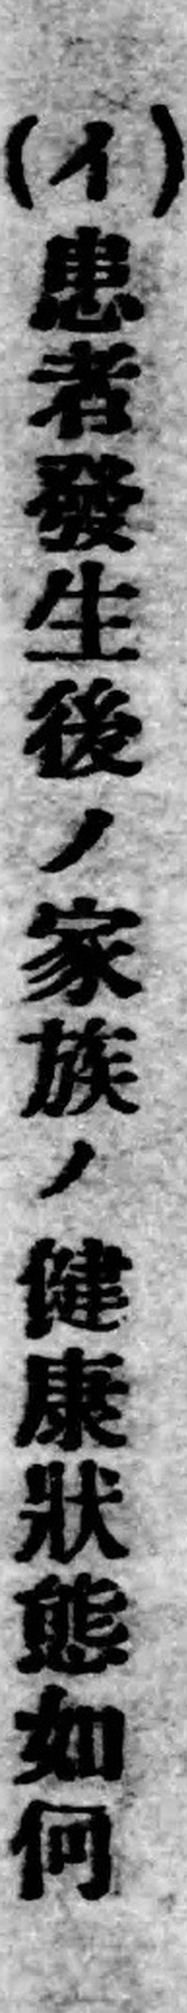(イ)患者發生後ノ家族ノ健康狀態如何
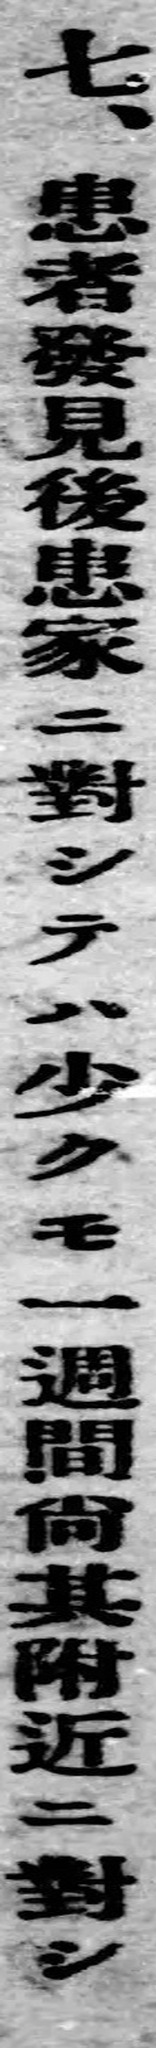七、患者發見後患家ニ對シテハ少クモ一週間尚其附近ニ對シ
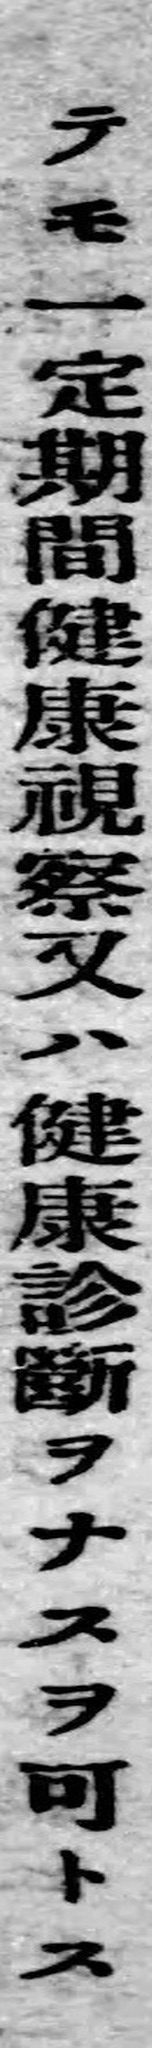テモ一定期間健康視察又ハ健康診斷ヲナスヲ可トス
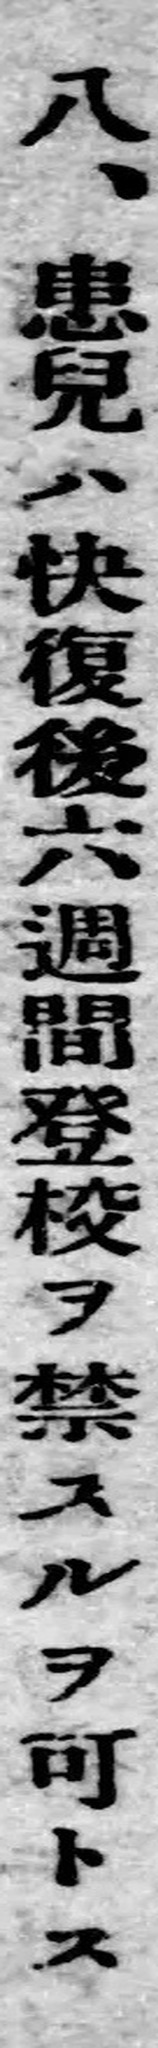八、患兒ハ快復後六週間登校ヲ禁スルヲ可トス
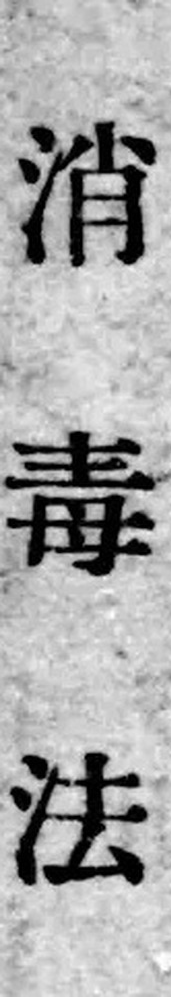消毒法
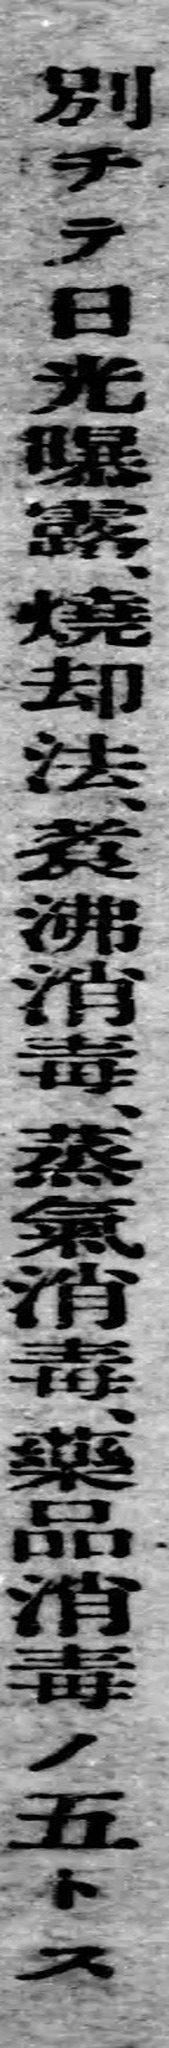別チテ日光曝露、燒却法、煑沸消毒、蒸氣消毒、藥品消毒ノ五トス

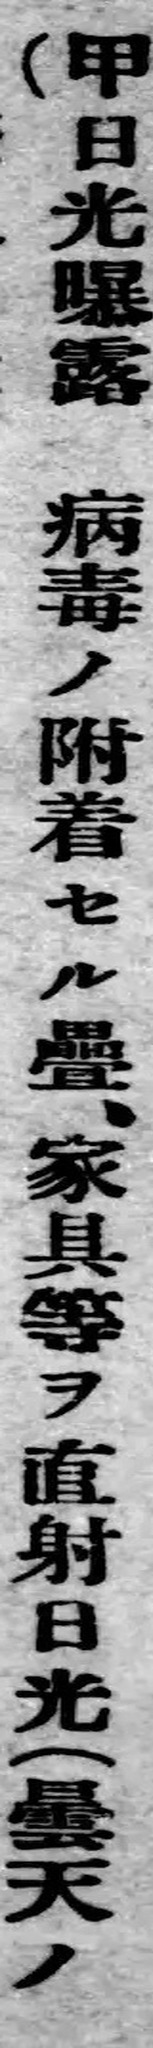(甲)日光曝露病毒ノ附着セル疊、家具等ヲ直射日光(曇天ノ
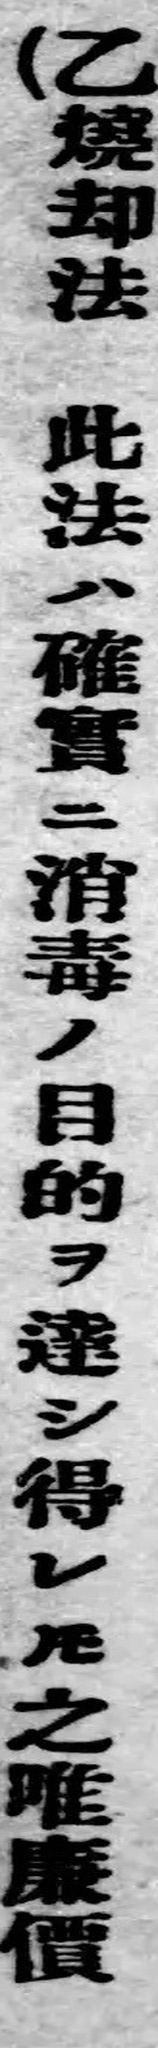(乙)燒却法此法ハ確實ニ消毒ノ目的ヲ達シ得レトモ之唯廉價
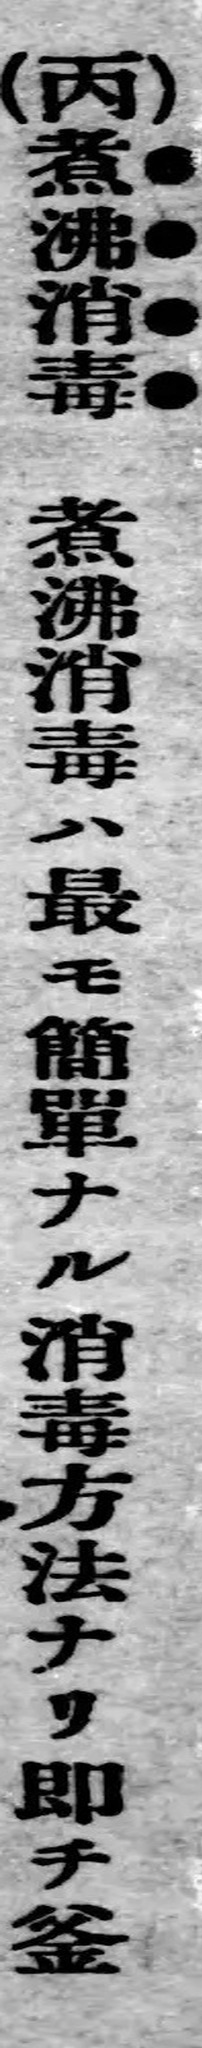(丙)煮沸消毒煮沸消毒ハ最モ簡單ナル消毒方法ナリ即チ釜
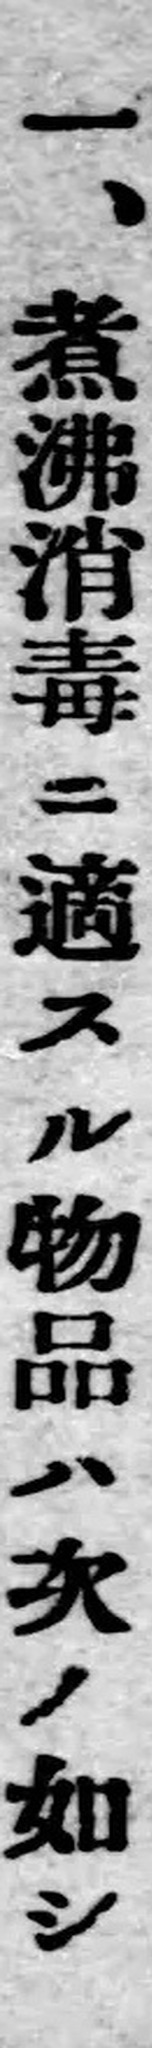一、煮沸消毒ニ適スル物品ハ次ノ如シ
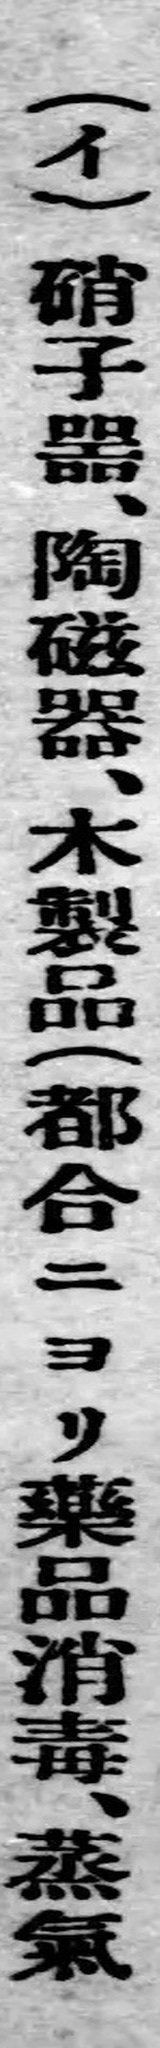(イ)硝子器、陶磁器、木製品(都合ニヨリ藥品消毒、蒸氣
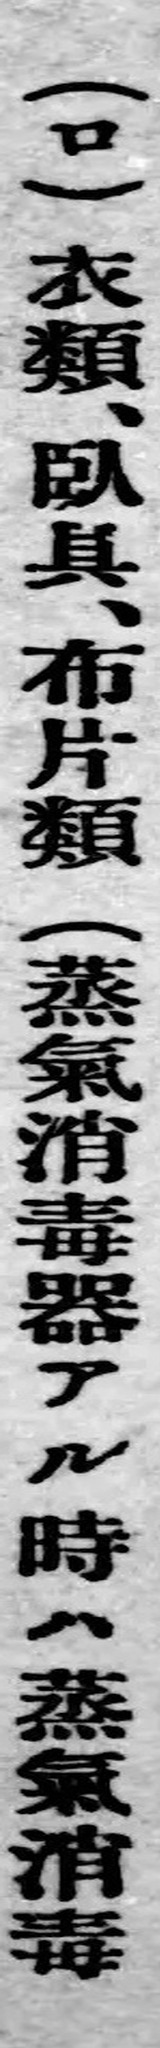(ロ)衣類、臥具、布片類(蒸氣消毒器アル時ハ蒸氣消毒
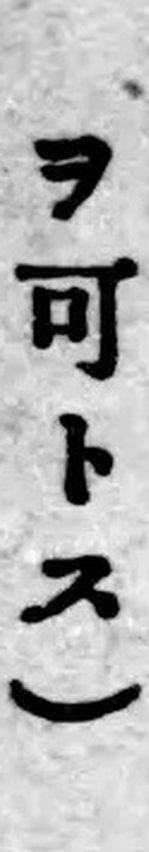ヲ可トス)
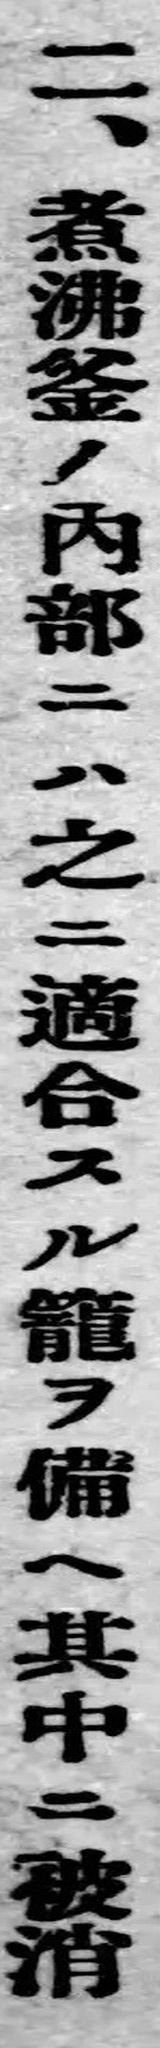二、煮沸釜ノ内部ニハ之ニ適合スル籠ヲ備ヘ其中ニ被消
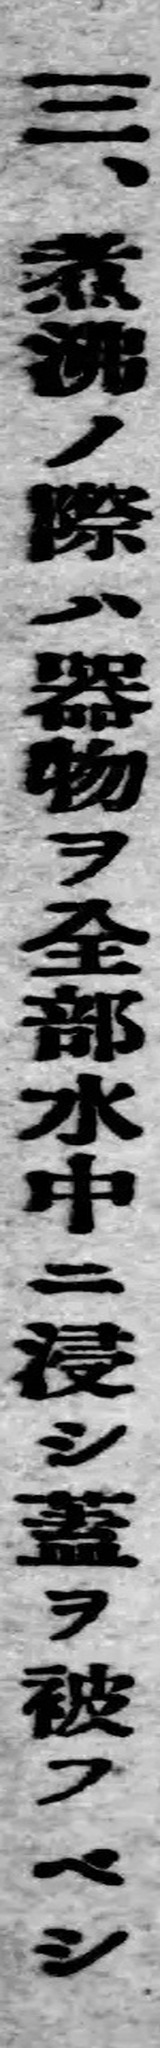三、煮沸ノ際ハ器物ヲ全部水中ニ浸シ蓋ヲ被フベシ
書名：袖珍防疫必携
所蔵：国立国会図書館 National Diet Library, JAPAN
